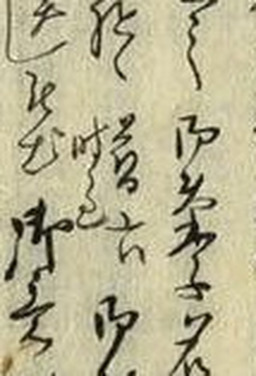十六日
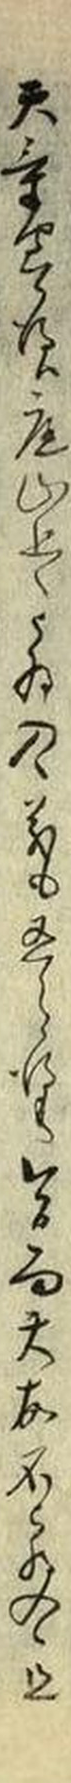天気宜候得ハ庭山上へ被為入候義も有之候得共今日雨天故不被為入候且
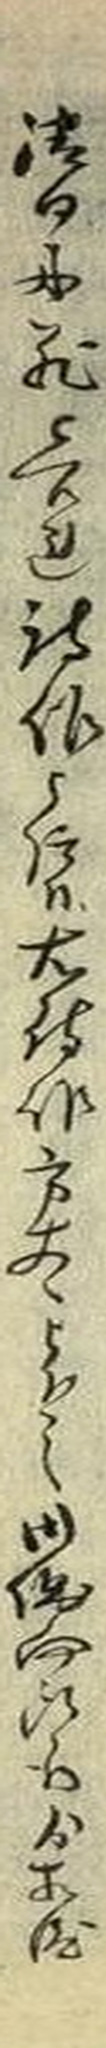清田丹蔵被召連詩作被仰付右詩作方丈へ被下之御側向頭取ゟ相渡
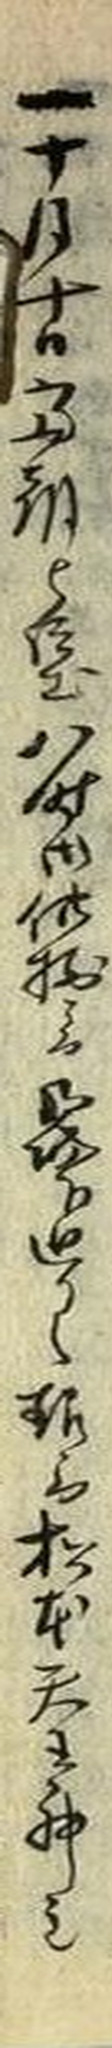一十月十日当朝被仰出八時御供揃ニ而御城下廻り之趣ニ而松本天王神主
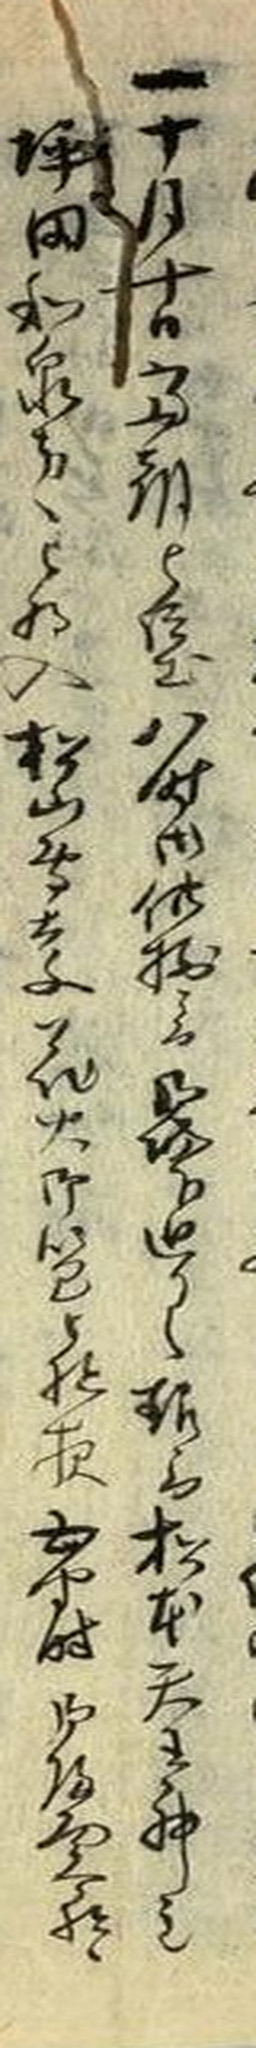坪田和泉方へ被為入松山専太夫花火御覧被遊夜五半時御帰殿被遊候
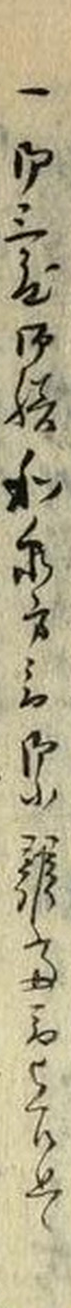一御三度御膳和泉方ニ而御小弁当ニ而被召上候
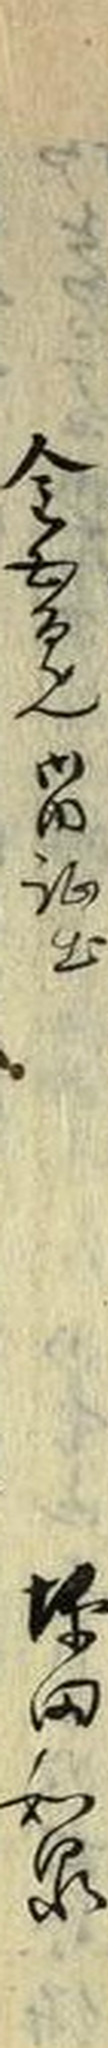金五百疋御内証出坪田和泉
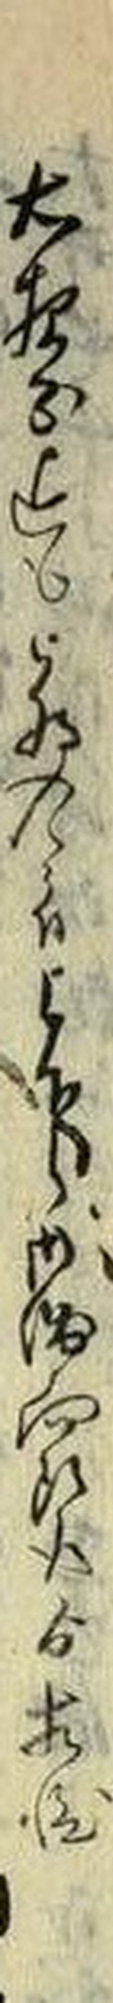右夜分迄も被為入候ニ付被下之御側向頭取ゟ相渡
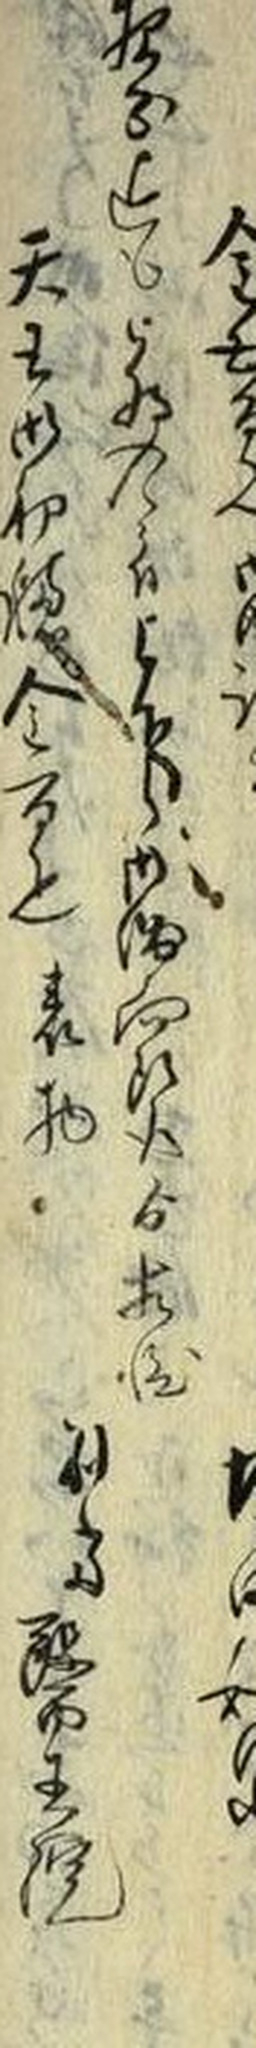天王御初穂金百疋表物別当医王院
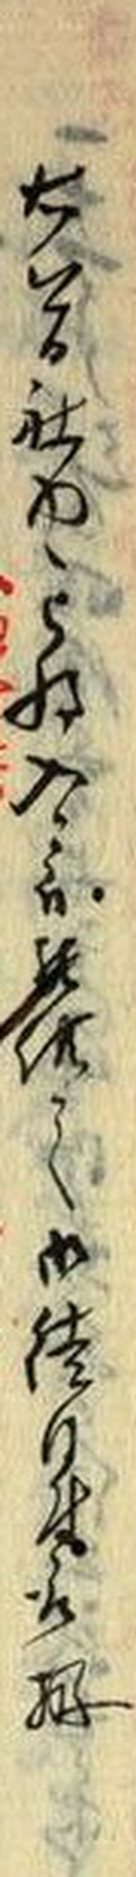右今日社内へ被為入候ニ付被供之御徒目付取扱
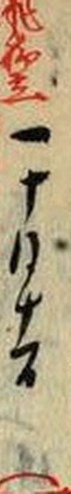一十月十一日
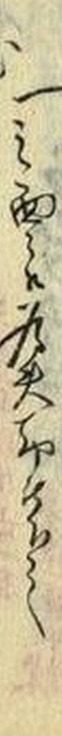之面々江為失却被下之
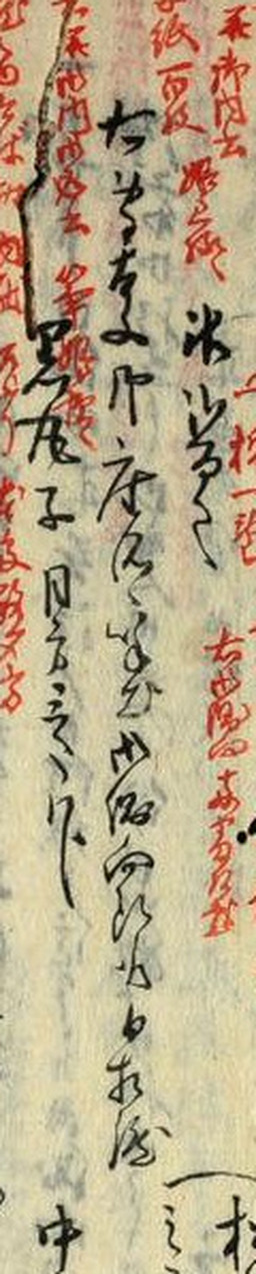右専太夫御座所へ呼出御側向頭取ゟ相渡
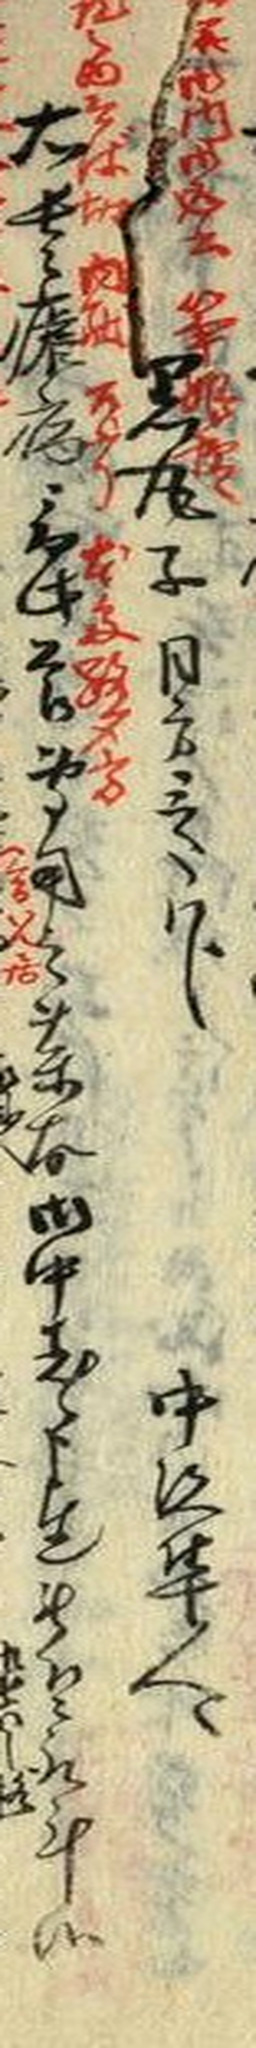右長々瘧病ニ而此節専用之薬故御中老へ申達被下ニ取計候
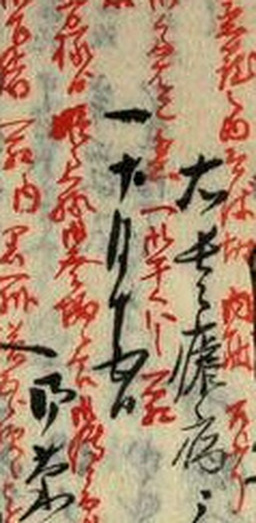一十月十五日
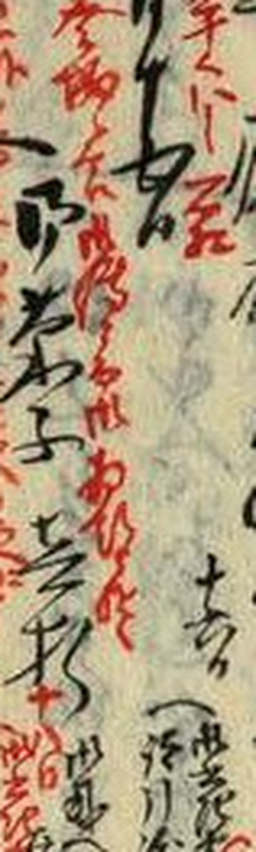御菓子壱折
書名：少傅日録抄（斉承付側向頭取日記、在国）
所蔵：福井県文書館 Fukui Prefectural Archives
